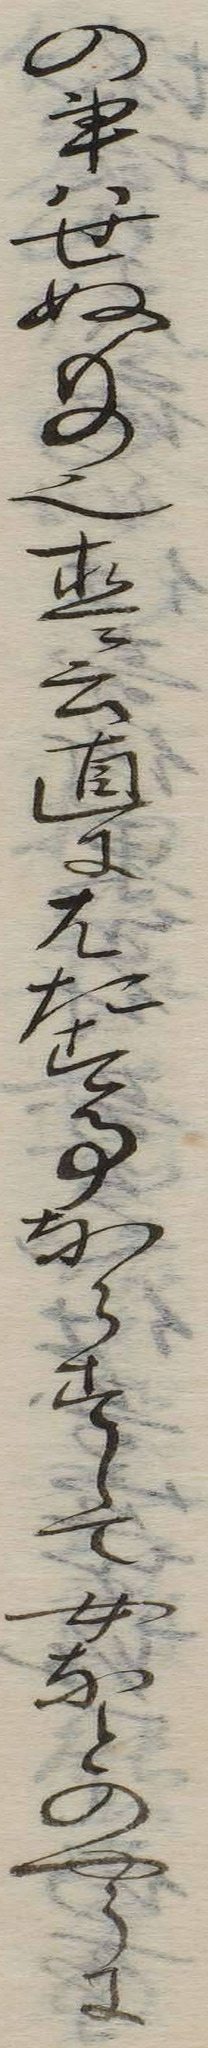の事はせぬもの也直ニにはたす事ならすして女なとのやうに
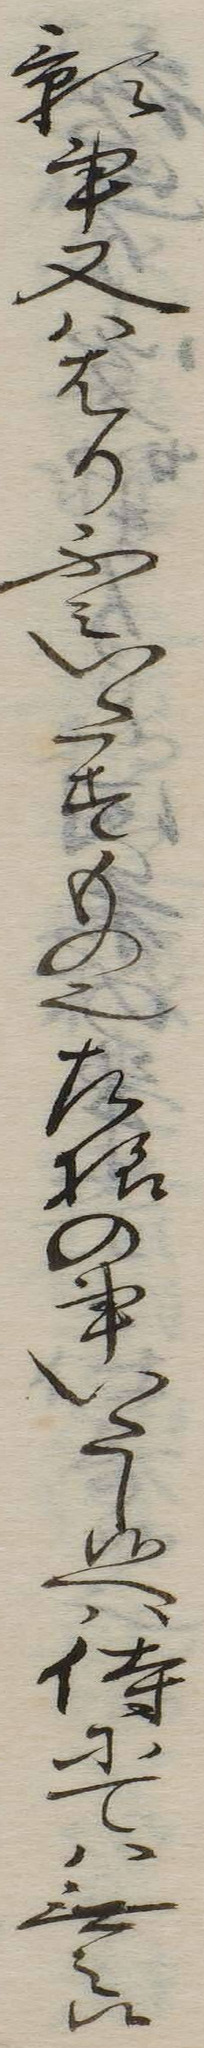影事又ははりふみいたすもの也左様の事いたし候へは侍にては無之候
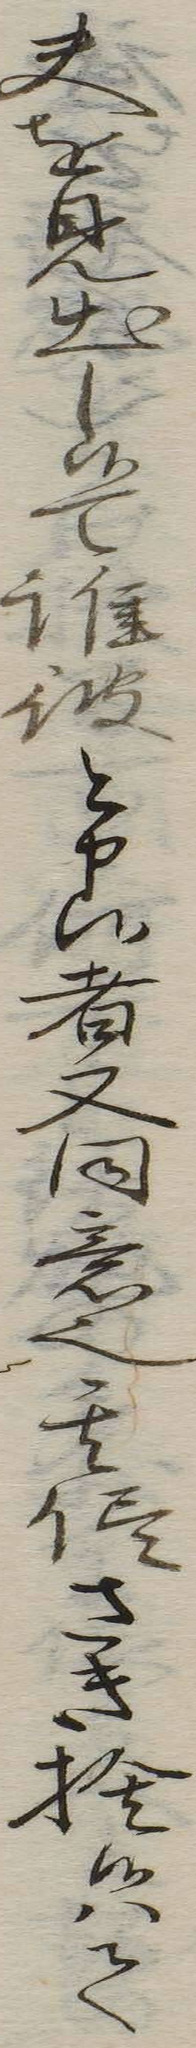夫を見出し候て誰彼と申候物又同意也其侭さき捨候はて
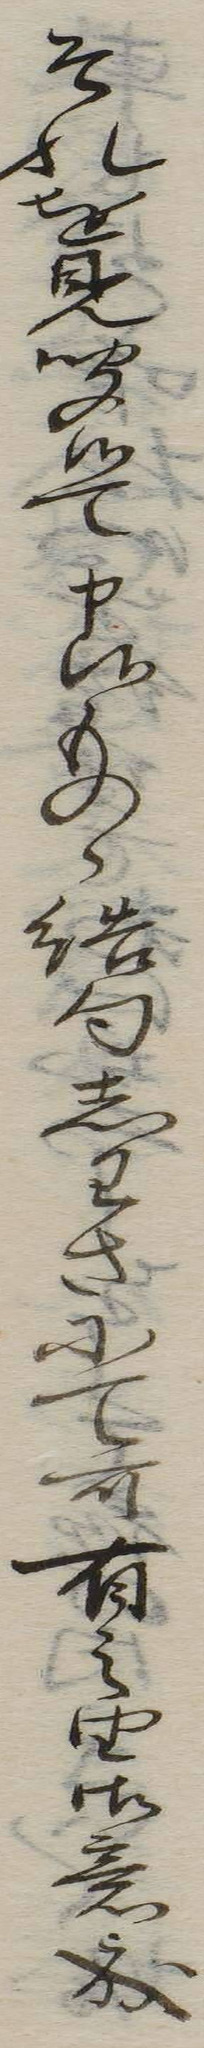それを見聞候て申候ものゝ結句しわさにて可有之由御意成
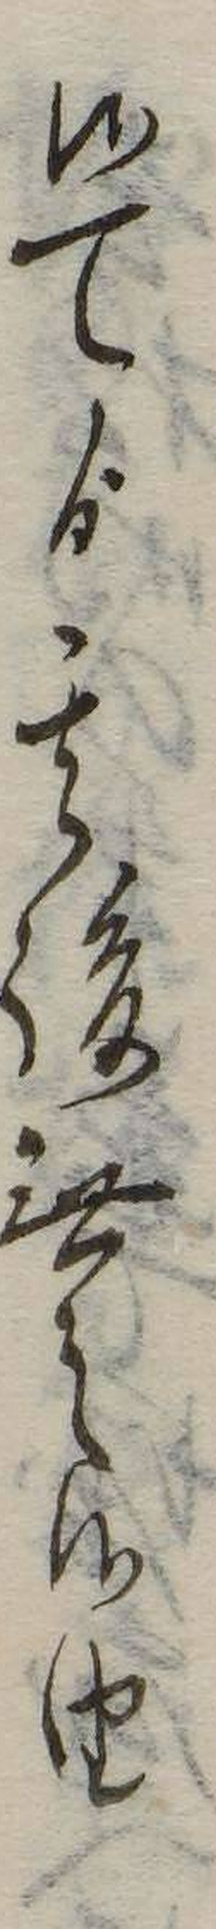候てゟ其後無之候由
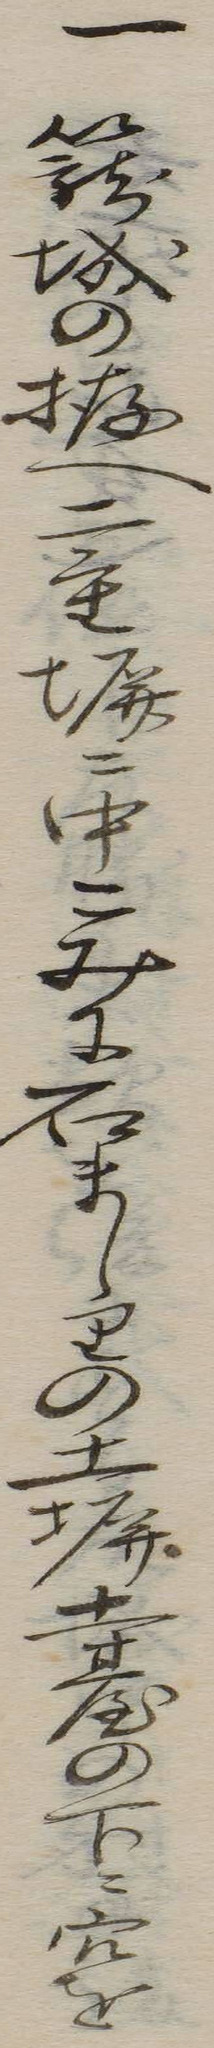一籠城の拵へ二重堀ニ中こみに石ましりの土塀土台の下ニ穴を
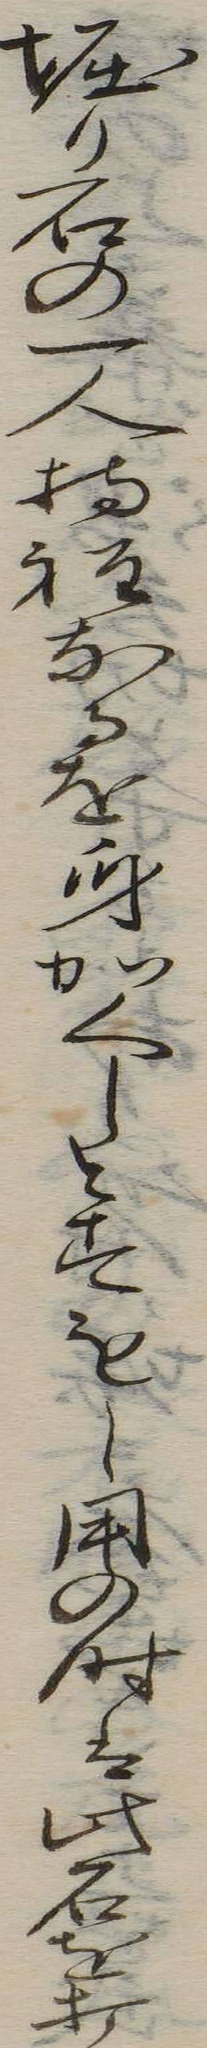堀り石の一人持程なるを身かくしとすもし用の時は此石を打
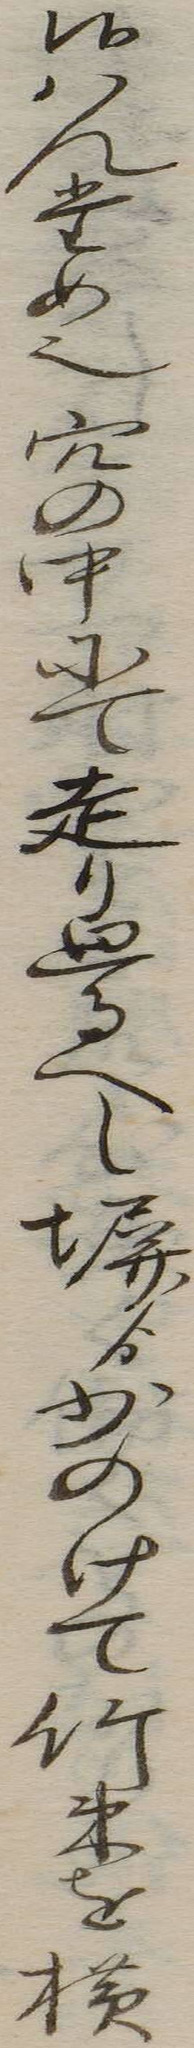候はんため也穴の中にて走り廻るへし塀ゟ少のけて竹束を横
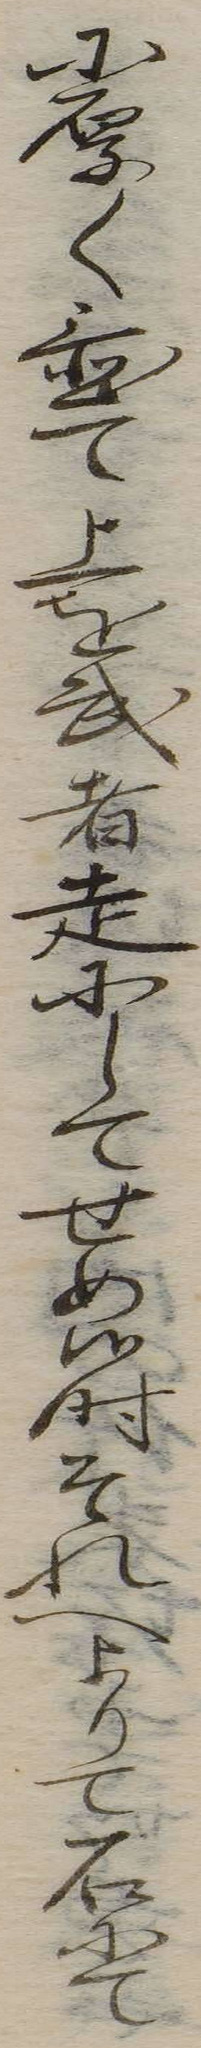に厚く置て上を武者走にしてせめ候時それへよりて石にて

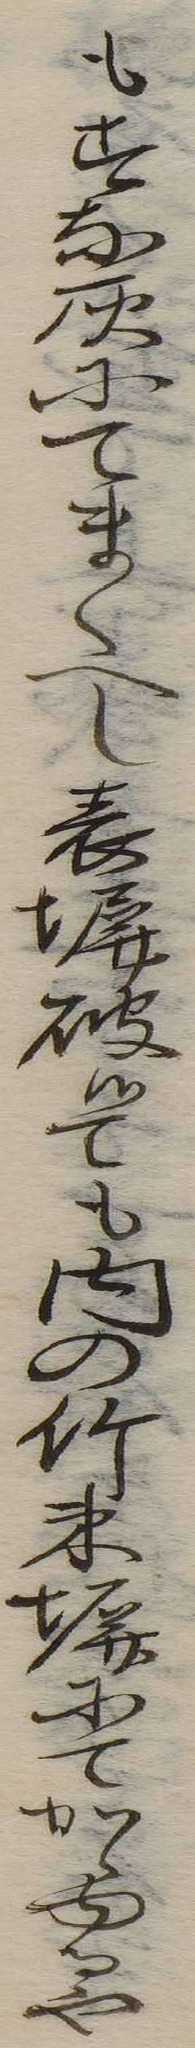もすな灰にてまくへし表塀破候ても内の竹束塀にてかゝゆるや
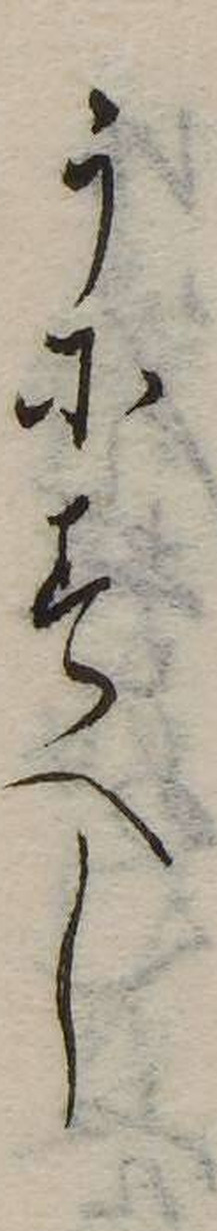うにすへし
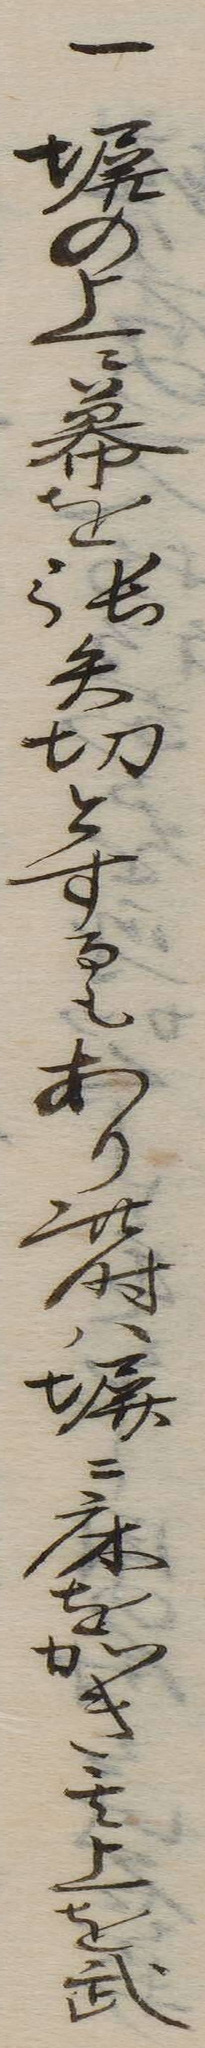一塀の上に幕を張矢切とするもあり此時は塀ニ床をかき其上を武
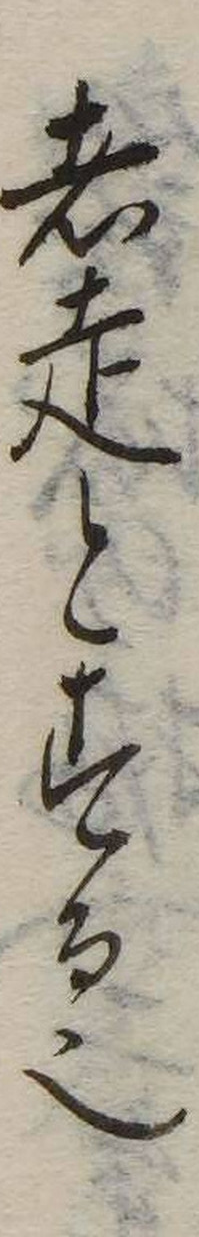者走とする也
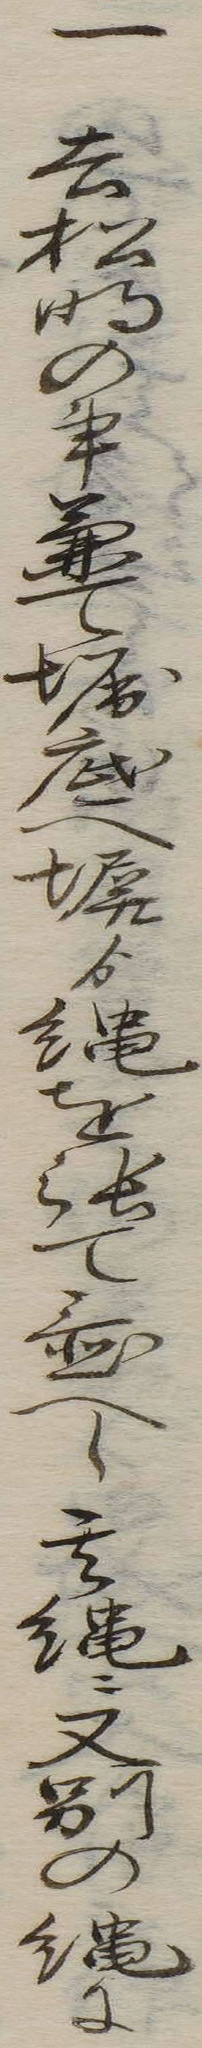一去松明の事兼て堀底へ塀ゟ縄を張て置へし其縄ニ又別の縄に
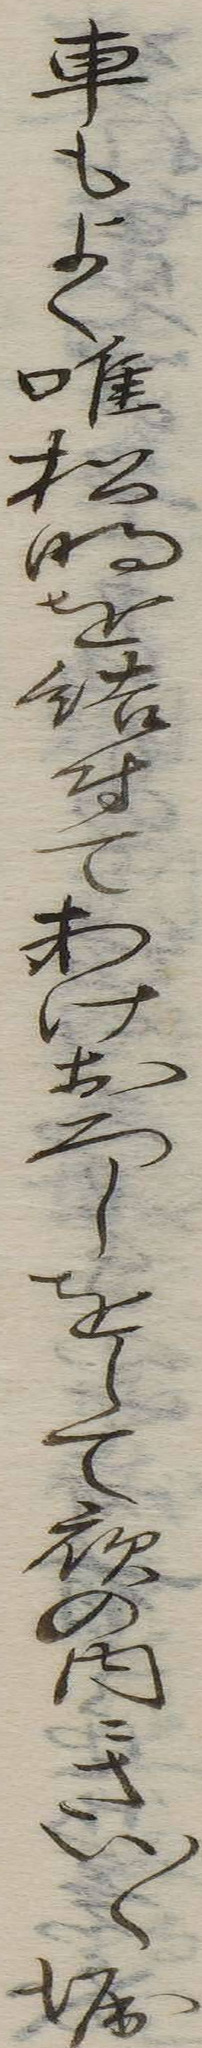車もよく唯松明を結付てあけおろしをして夜の内ニさい〳〵堀
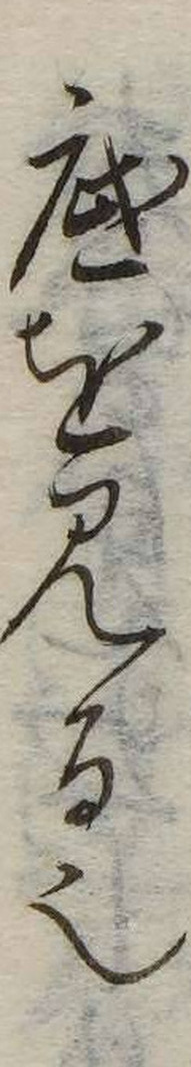底を見る也
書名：三河之物語
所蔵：国文学研究資料館
